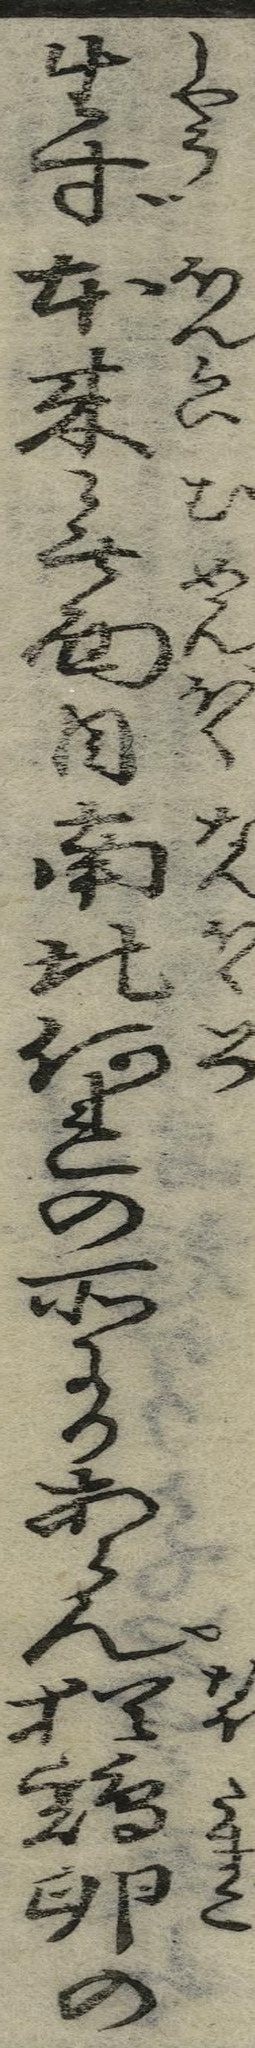生ず本来無面目南北何れの所にかあらん。猶鶏卵の
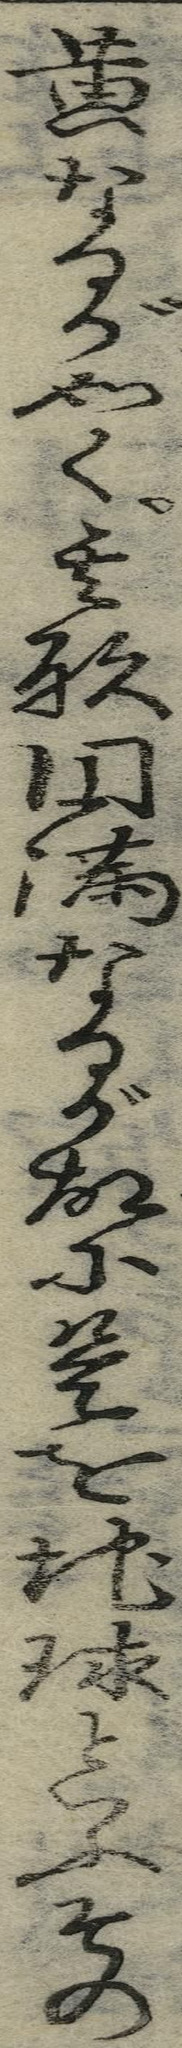黄なるが如く。其形円満なるが故に是を地球といふその
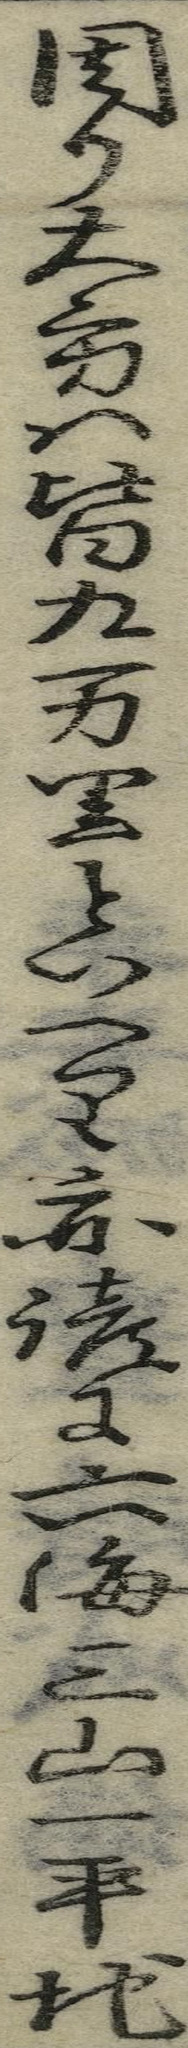周り大方は皆九万里といへり亦諺に六海三山一平地
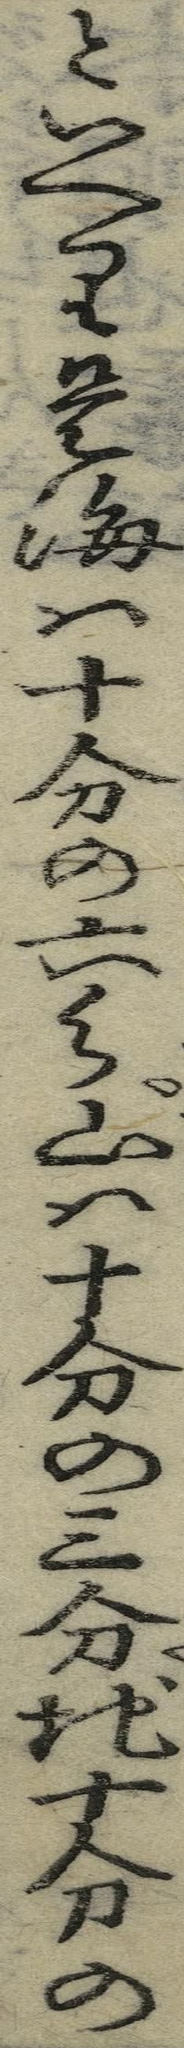といへり是海は十分の六分。山は十分の三分。地十分の
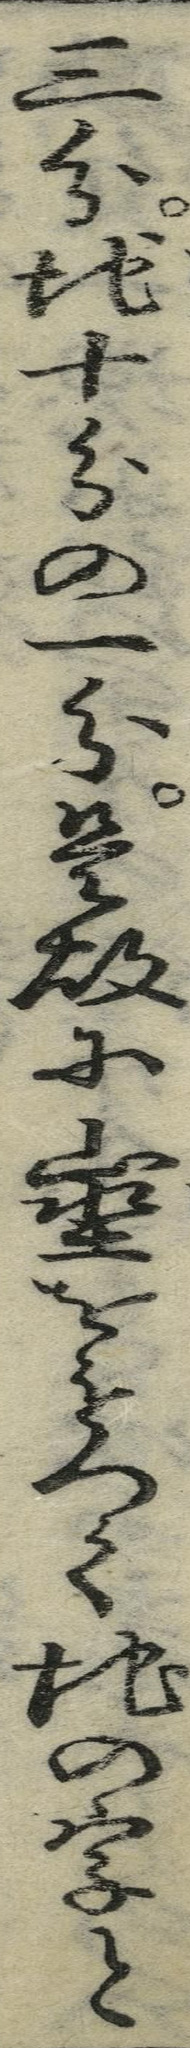三分。地十分の一分。是故に埊をもつて地の字と
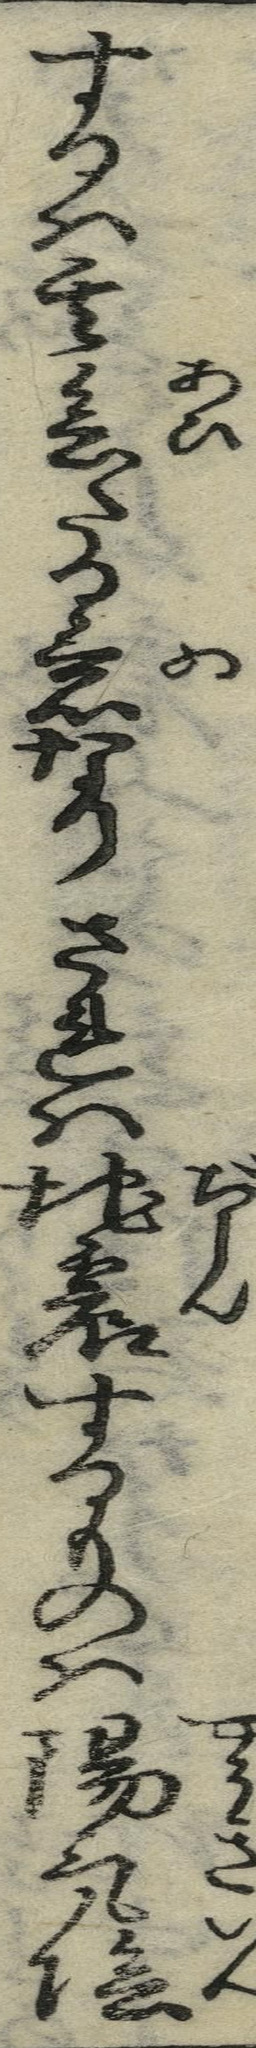するは其会たる意なりされは地震するものは陽気陰
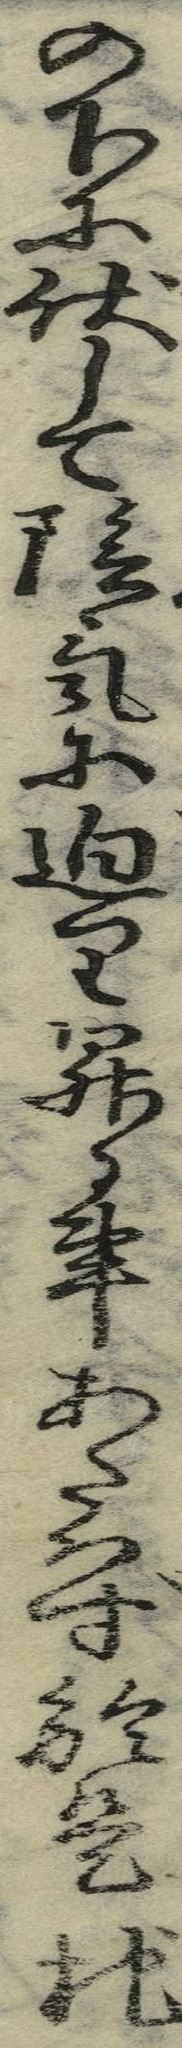の下に伏して陰気に迫り昇る事あたはず於是地
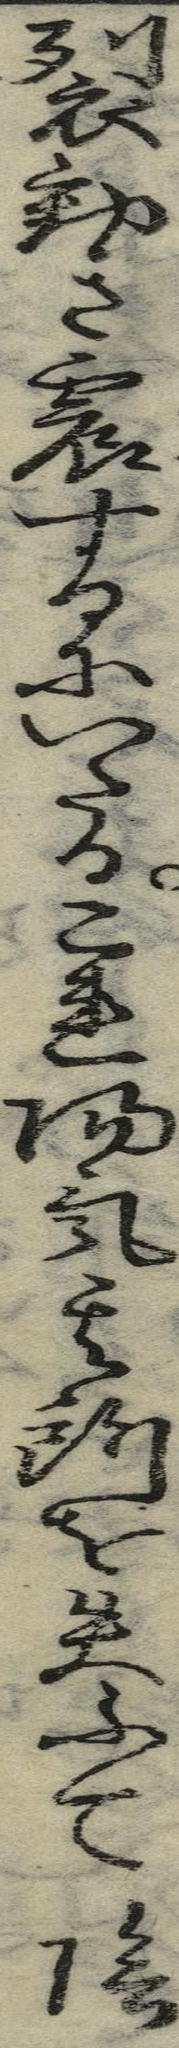裂動き震するにいたる。これ陽気其所を失ふて陰
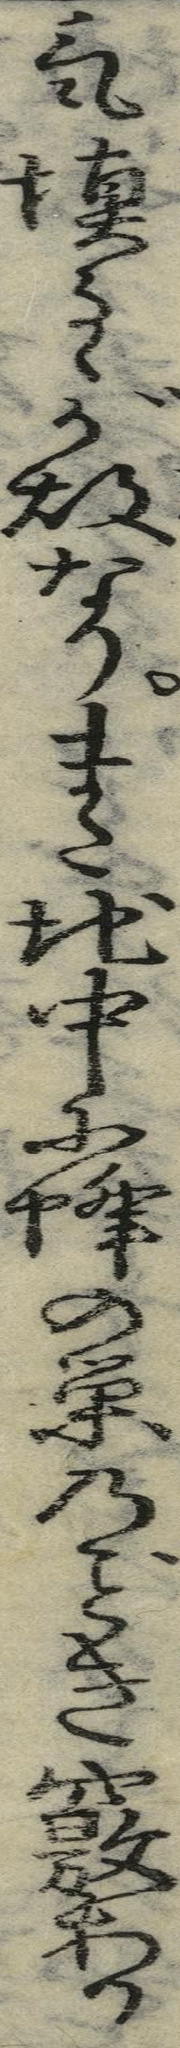気填るゝが故なり。また地中に蜂の巣のごとき竅あり
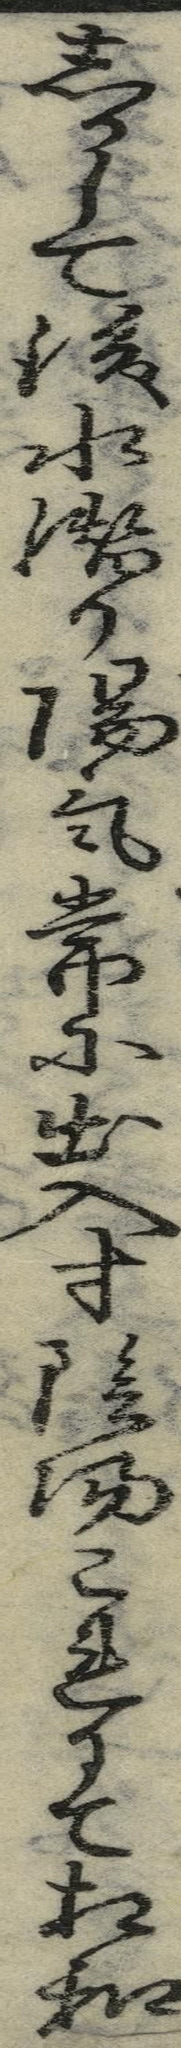しかして後水潜り陽気常に出入す陰陽これにて相和
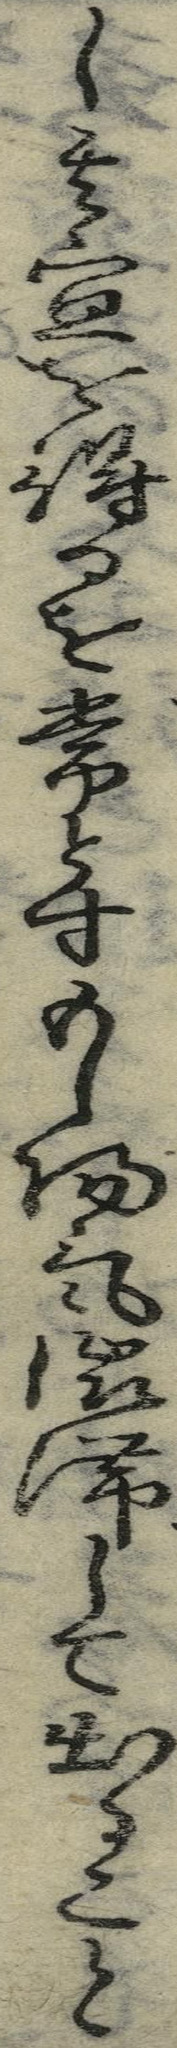し其宜を得るを常とすもし陽気渋滞して出ること
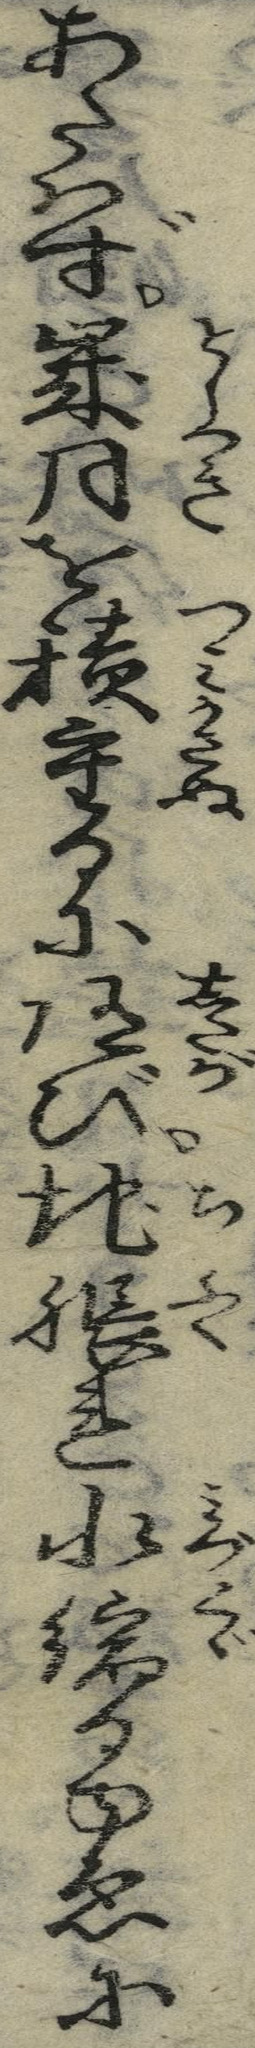あたはず。歳月を積重るに随び。地脹れ水縮るゆゑに

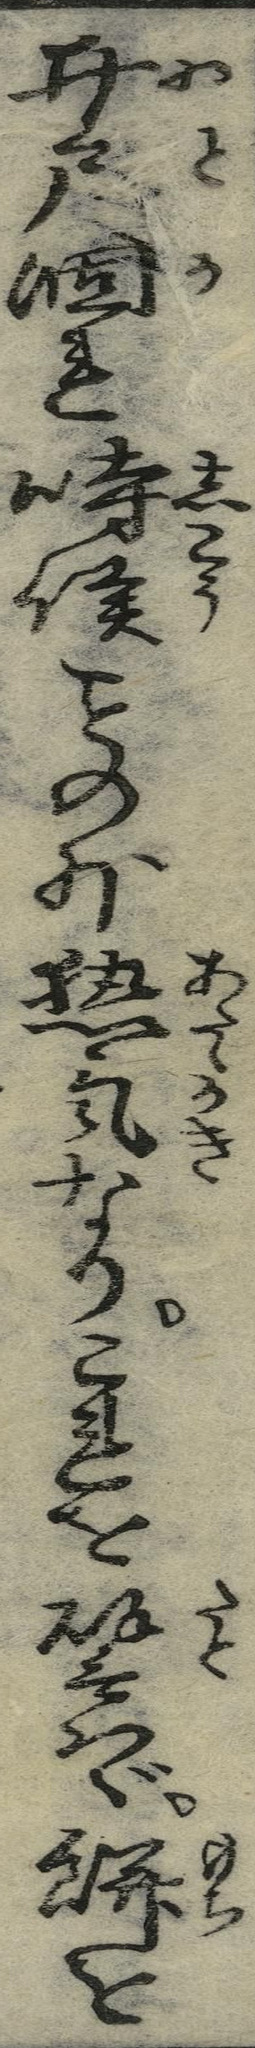井戸涸れ時候ことの外熱気なり。これを譬はゞ。餅を
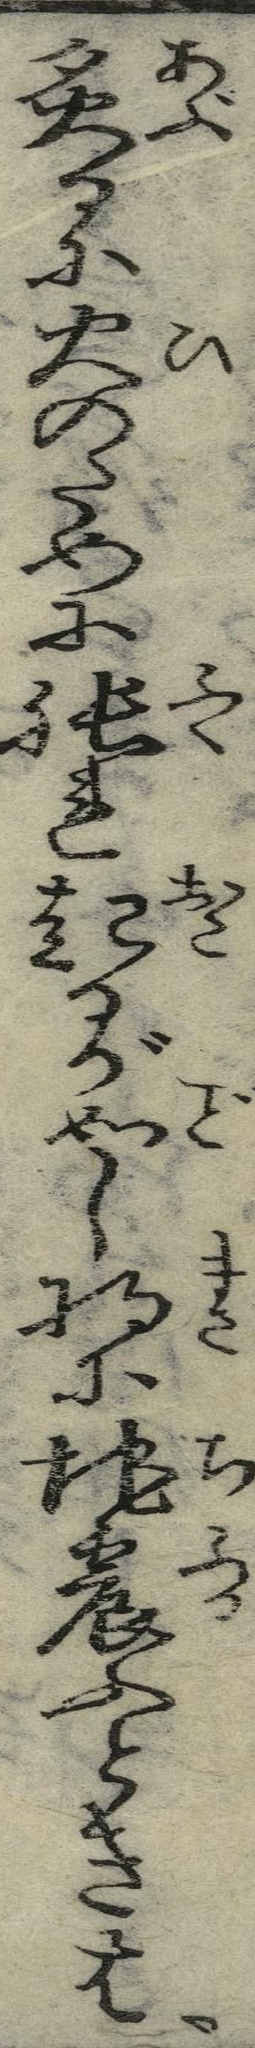炙るに火のために脹れ起るが如し将に地震ふときは。
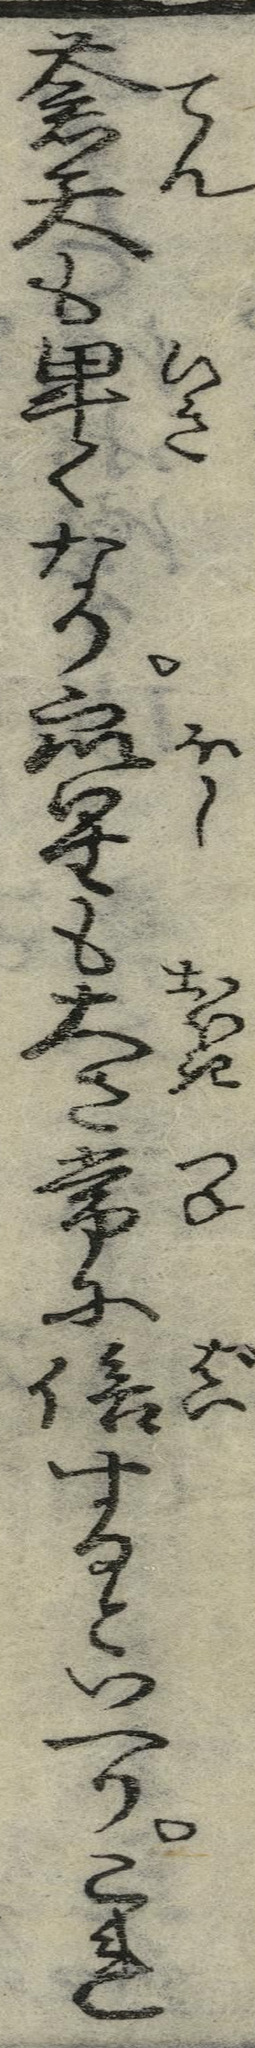蒼天も卑くなり。衆星も大さ常に倍するといへり。これ
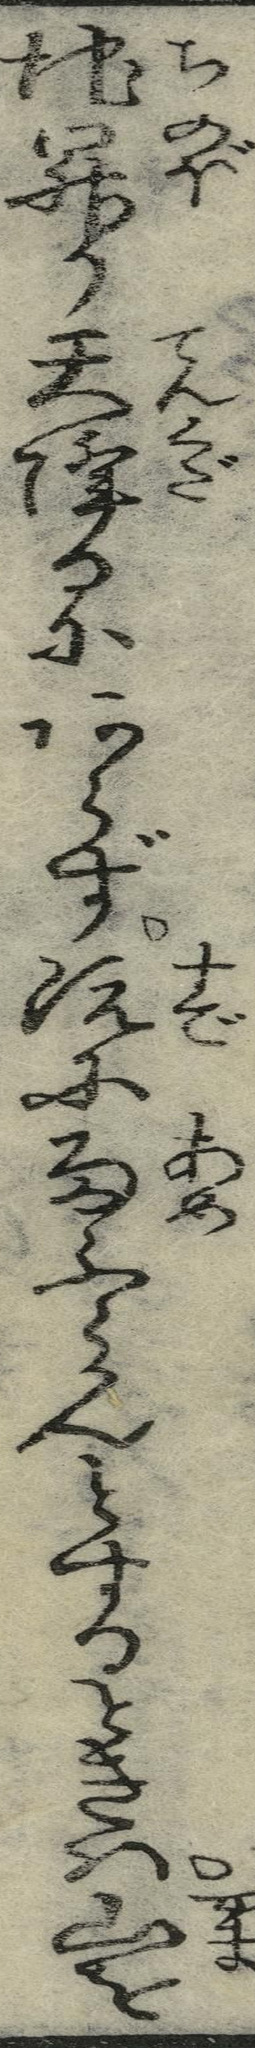地昇り天降るにあらず。既に雨ふらんとするときは。山を
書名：本朝地震記　全
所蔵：東京大学地震研究所図書室 Earthquake Research Institute Library, The University of Tokyo, JAPAN
